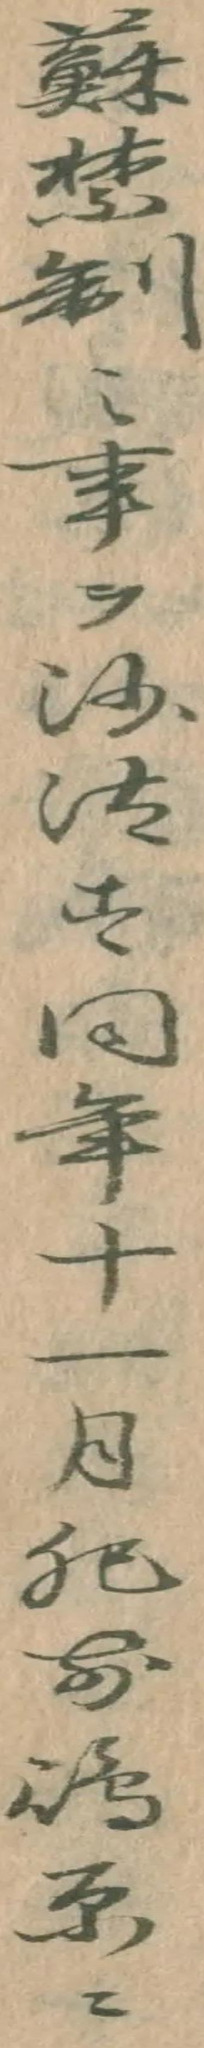蘇禁制之事ヲ沙汰す同年十一月肥前島原に
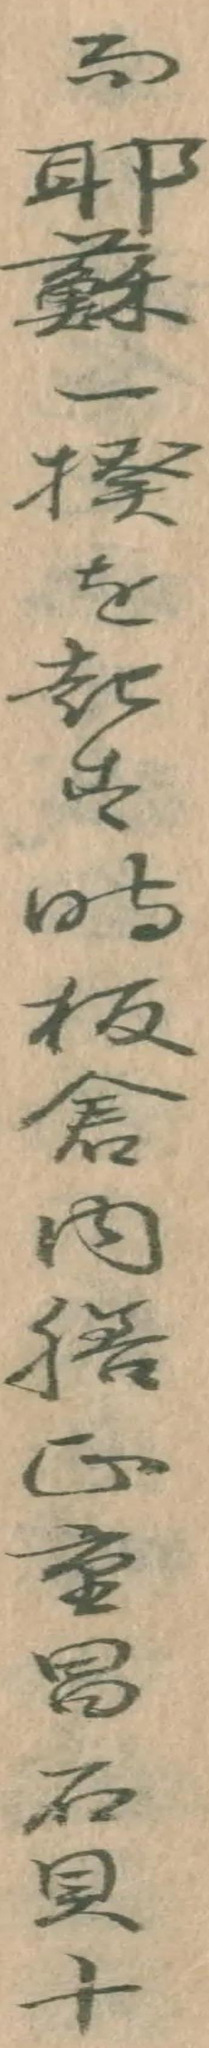而耶蘇一揆を起す時板倉内膳正重昌石貝十
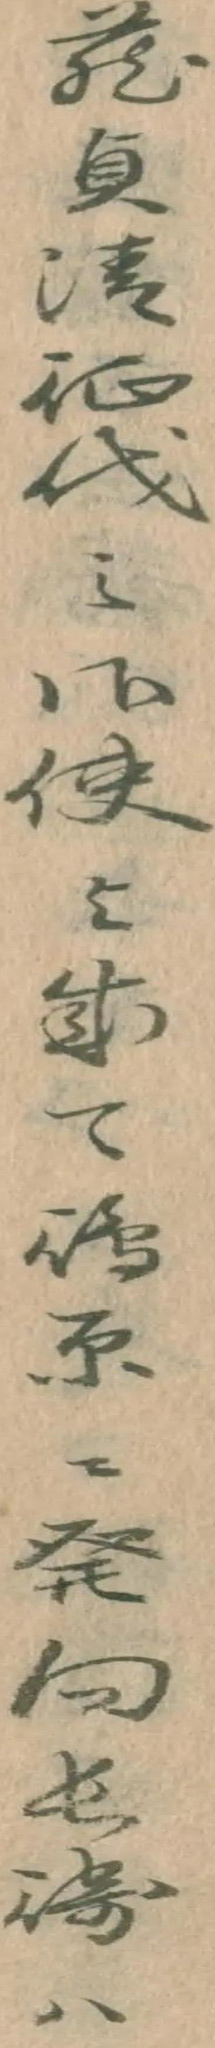蔵貞清征伐之御使と成て島原に発向長崎は
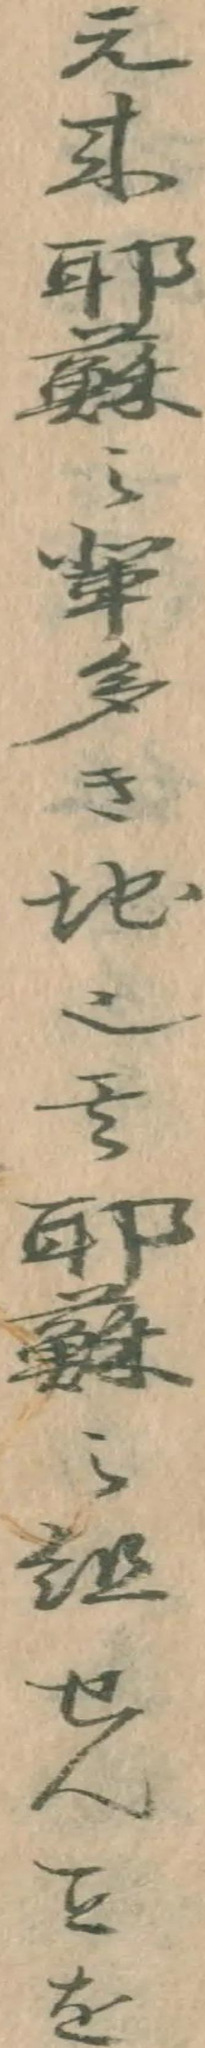元来耶蘇之輩多き地也其耶蘇の組せんことを
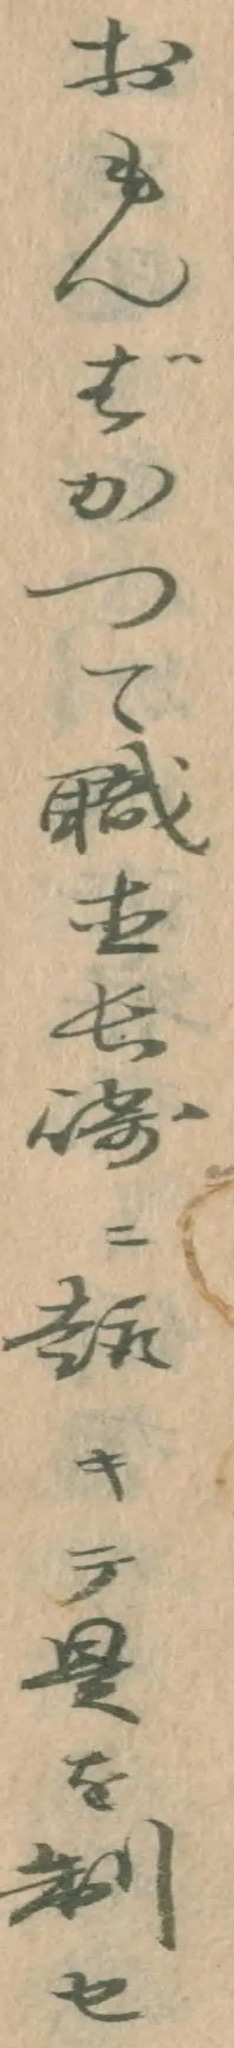おもんばかつて職直長崎に趣きて是を制せ

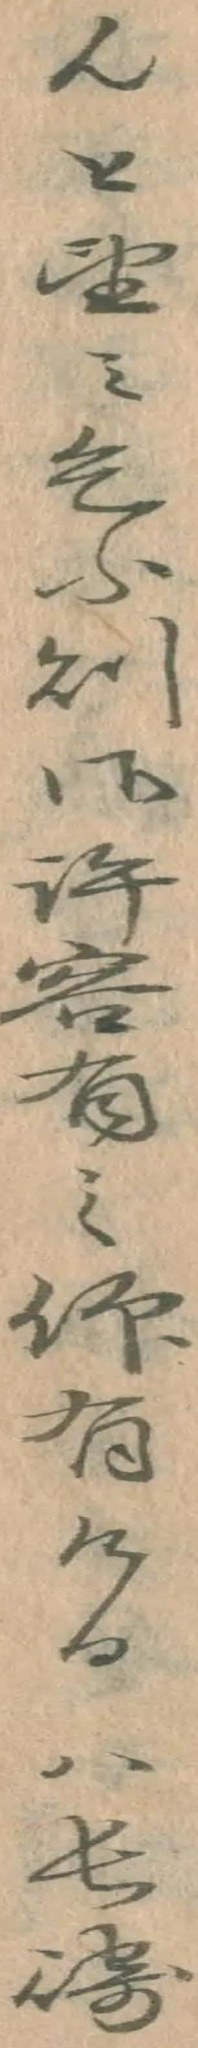んと望み乞ふ則御許容有之仰有けるは長崎
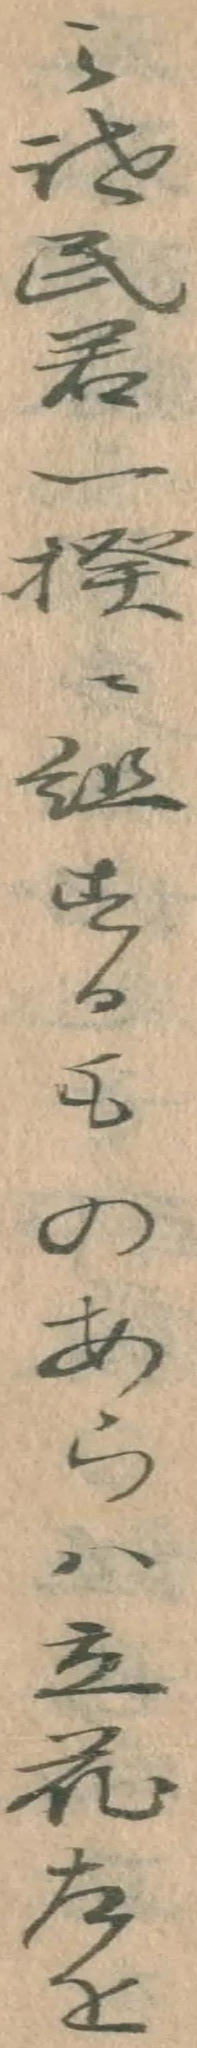之諸民若一揆に組するものあらは立花左近
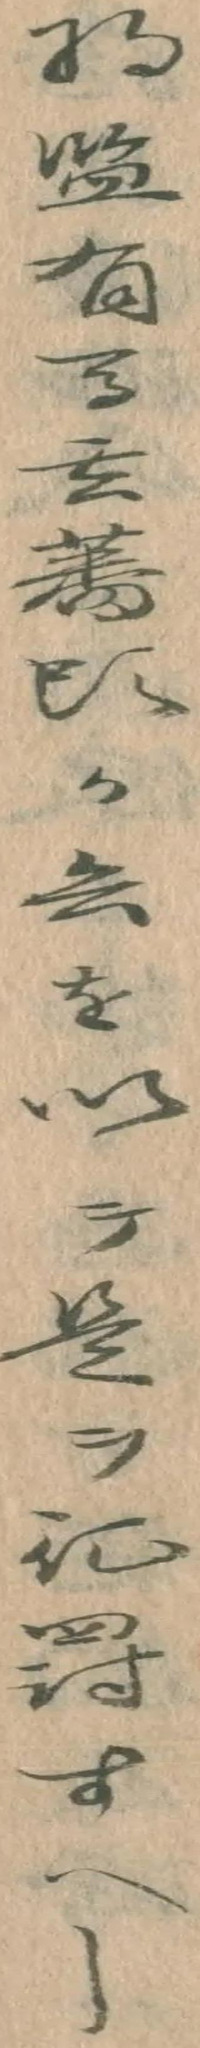将監有馬玄蕃頭か兵を以テ是ヲ征罰すへし
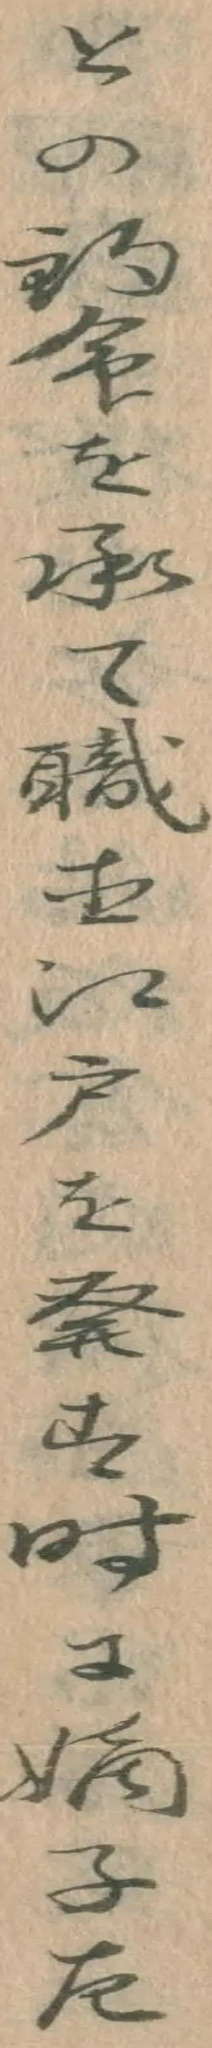との釣命を承て職直江戸を発す時に嫡子左
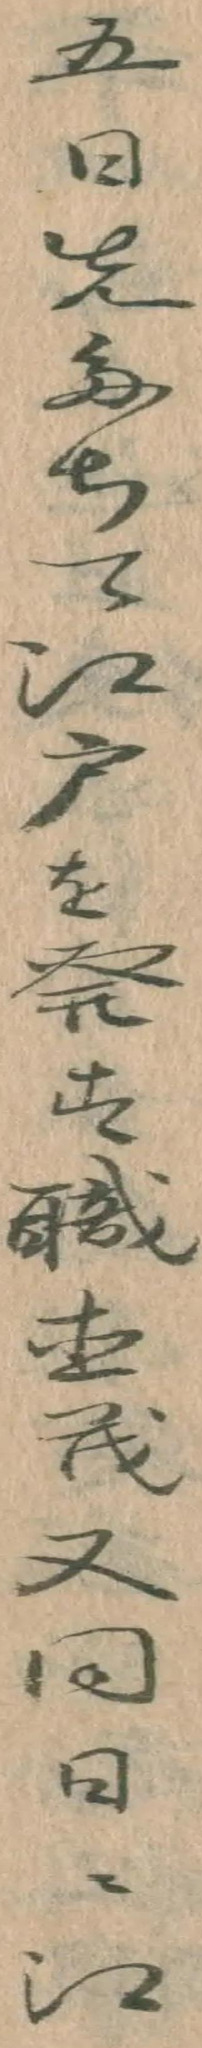五日先たちて江戸を発す職直も又同日に江
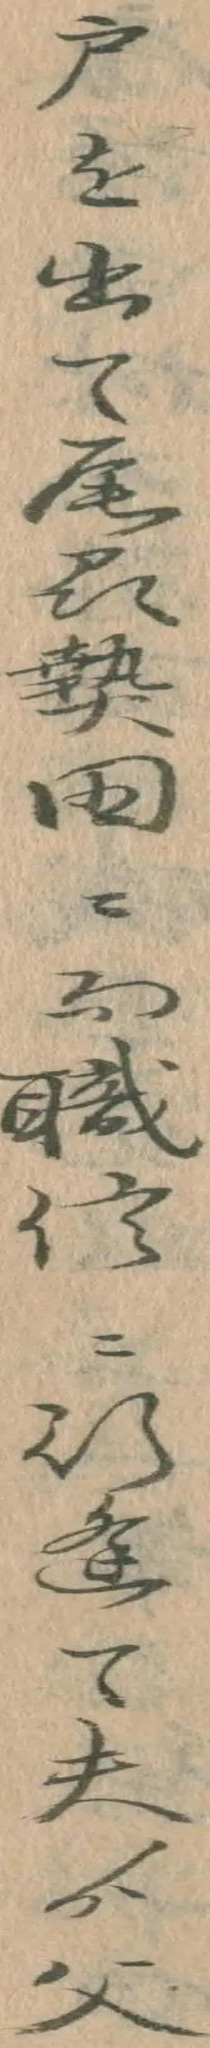戸を出て尾州熱田に而職信に行逢て夫ゟ父
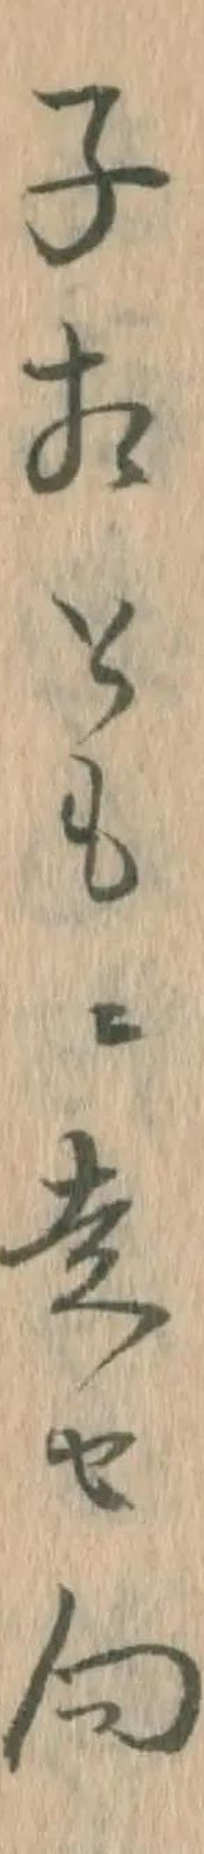子相ともに走せ向
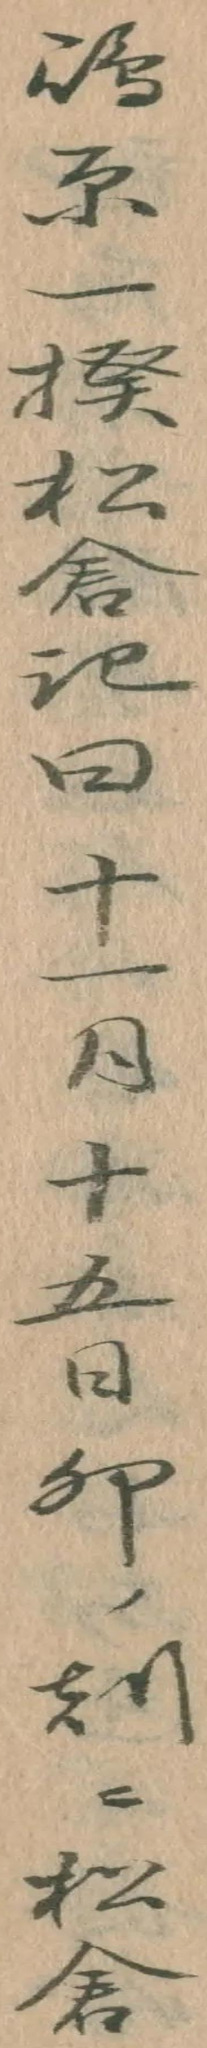島原一揆松倉記曰十一月十五日卯ノ刻に松倉
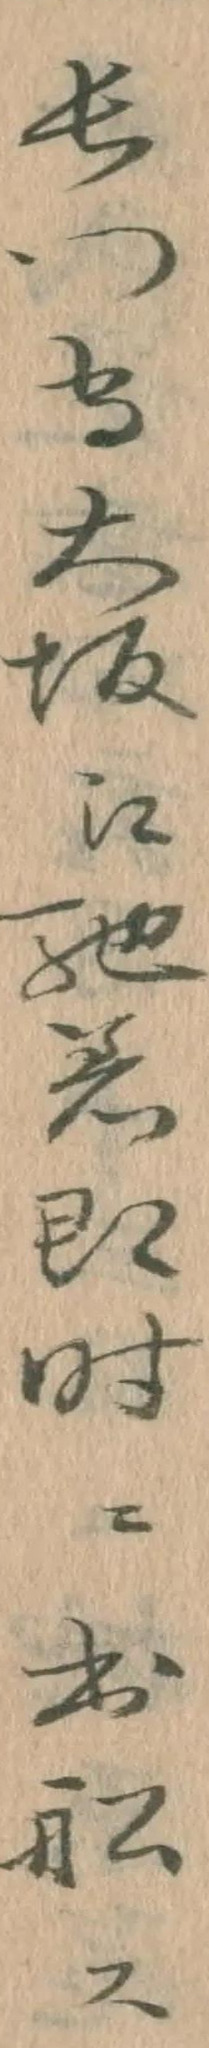長門守大坂江馳着即時に出船ス
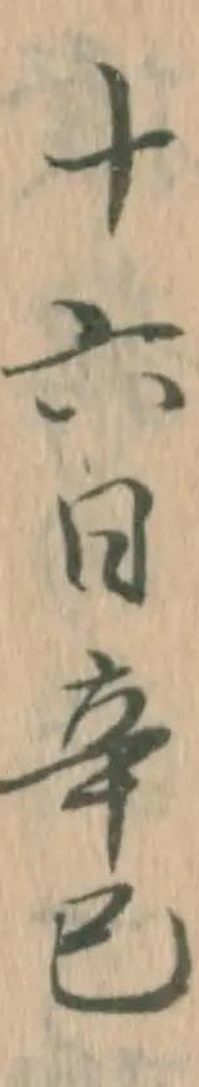十六日辛巳
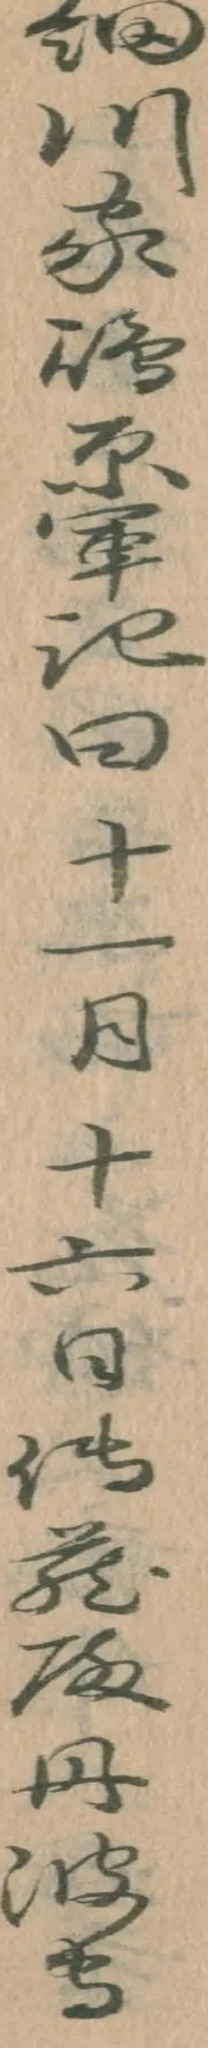細川家島原軍記曰十一月十六日伝蔵殿丹波守
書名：切支丹御退治記 49巻. [3]
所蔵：国立国会図書館 National Diet Library, JAPAN
